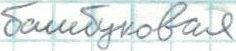бамбуковая
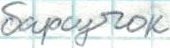барсучок
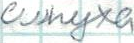сипуха
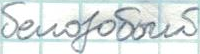белозобый
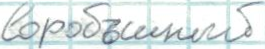воробьиный
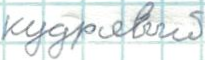кудрявый
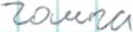чомга
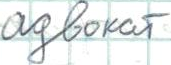адвокат
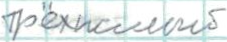трёхпалый
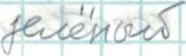зелёный
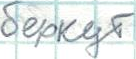беркут
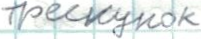трескунок
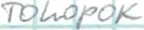топорок
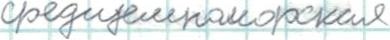средиземноморская
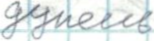дупель
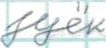зуёк
